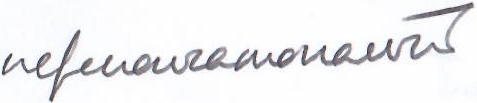перепончатопалый
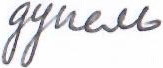дупель
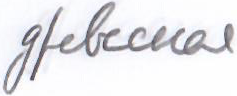древесная
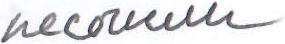песочник
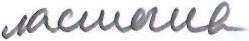ласточка
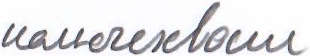колючехвост
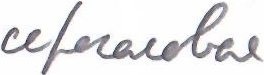сероголовая
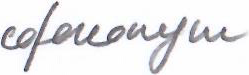сорокопут
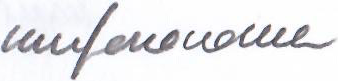широконоска
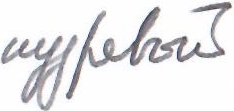кудрявый
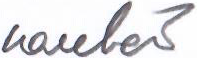полевой
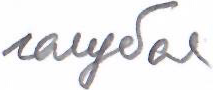голубая
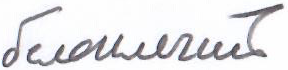белоплечий
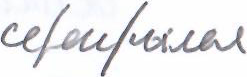серокрылая
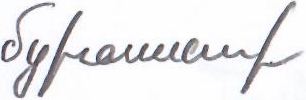бургомистр
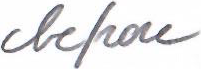сверок
